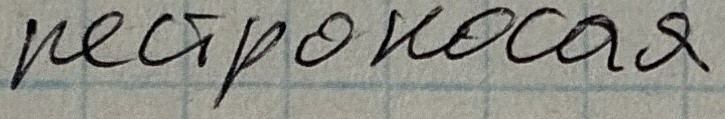пестроносая
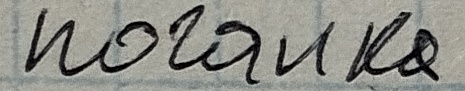поганка
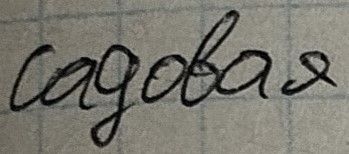садовая
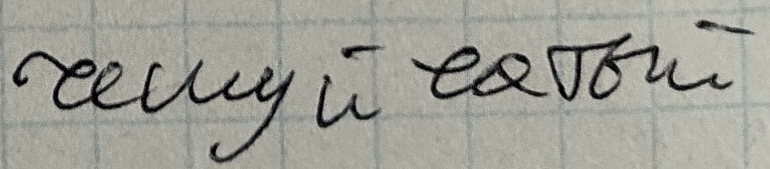чешуй чатый
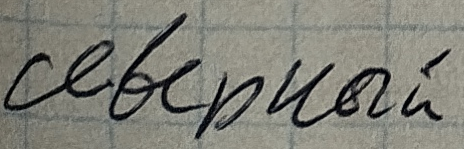северный
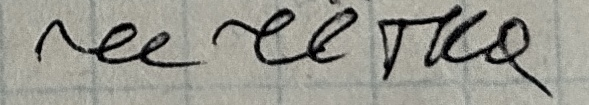чечетка
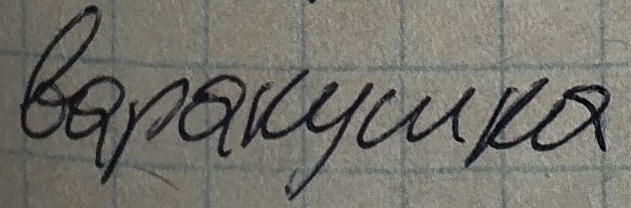варакушка
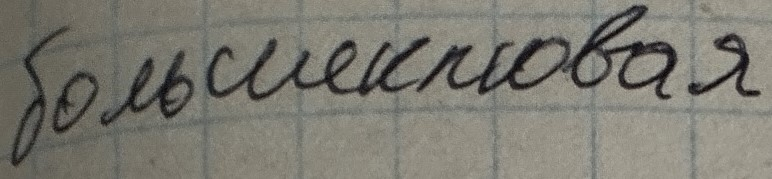большеклювая
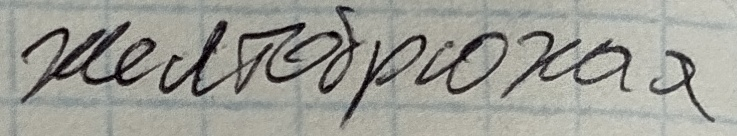желтобрюхая
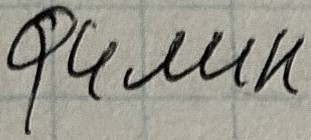филин
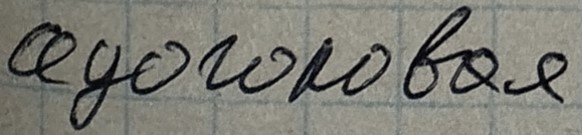седоголовая
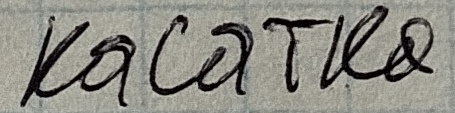касатка
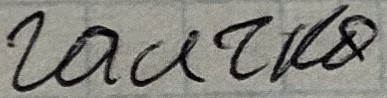гаичка
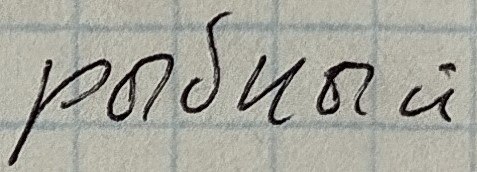рыбный
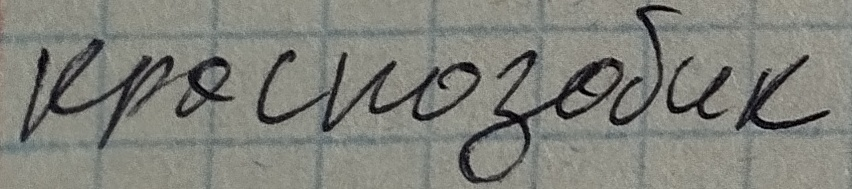краснозобик
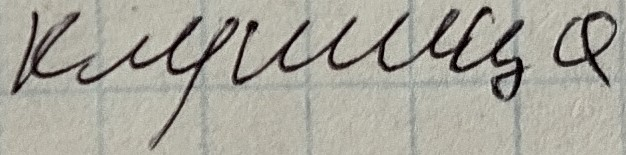клушица
